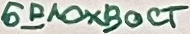белохвост
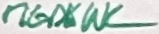пыжик
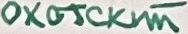охотский
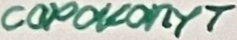сорокопут
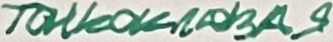тонкоклювая
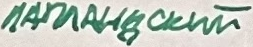лапландский
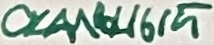скальный
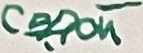седой
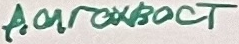долгохвост
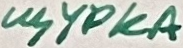щурка
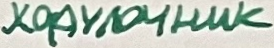ходулочник
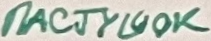пастушок
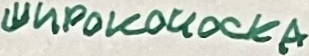широконоска
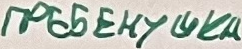гребенушка
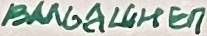вальдшнеп
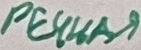речная
